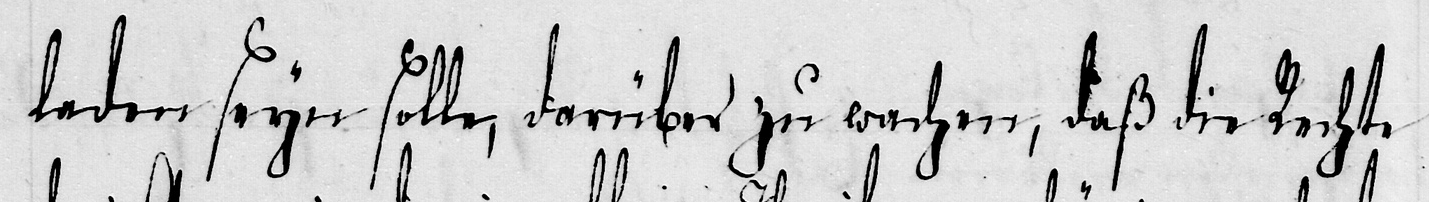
laden seyn solle, darüber zu wachen, daß die Rechte
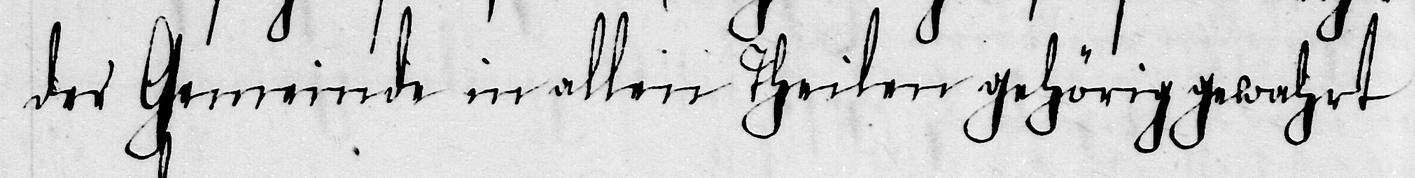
der Gemeinde in allen Theilen gehörig gewahrt
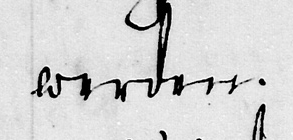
werden.
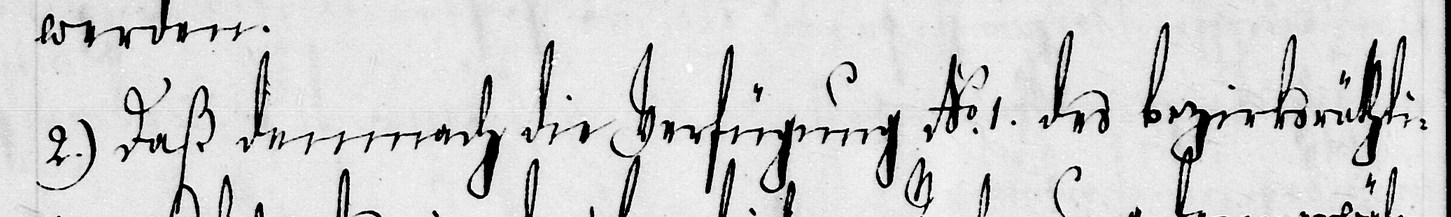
2.) Daß demnach die Verfügung No.1 des bezirksräthl¬
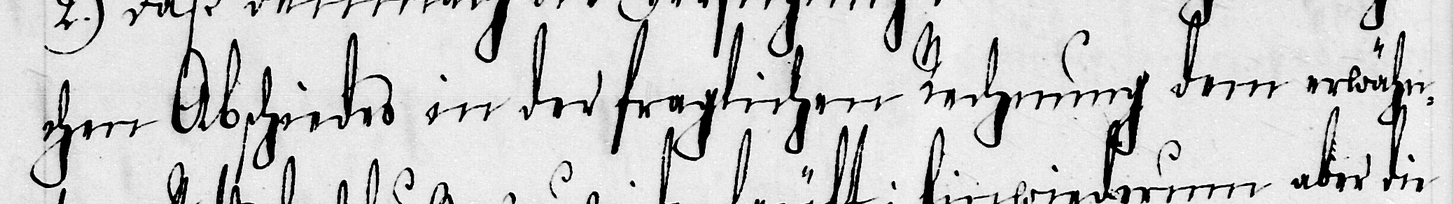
ichen Abschiedes in der fraglichen Rechnung dem erwähn¬
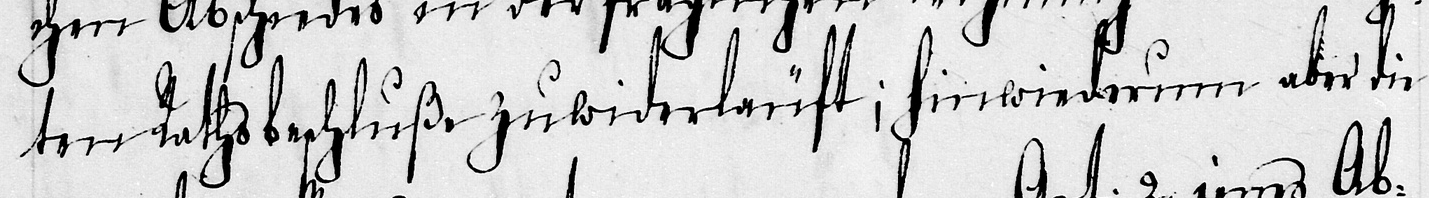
ten Rathsbeschluße zuwiderläuft; hinwiederum aber die
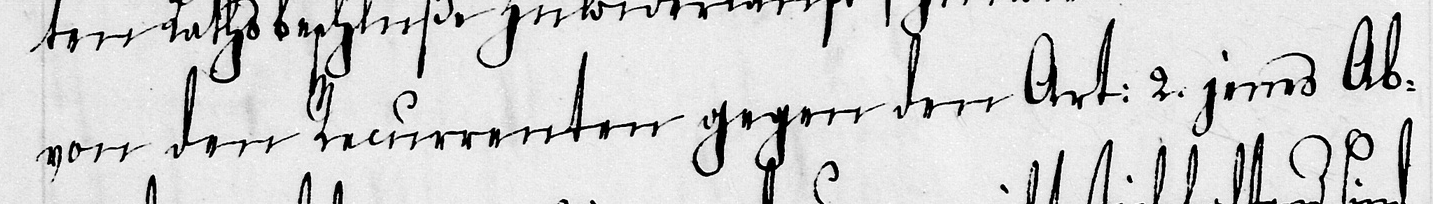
von den Recurrenten gegen den Art: 2. jenes Ab¬
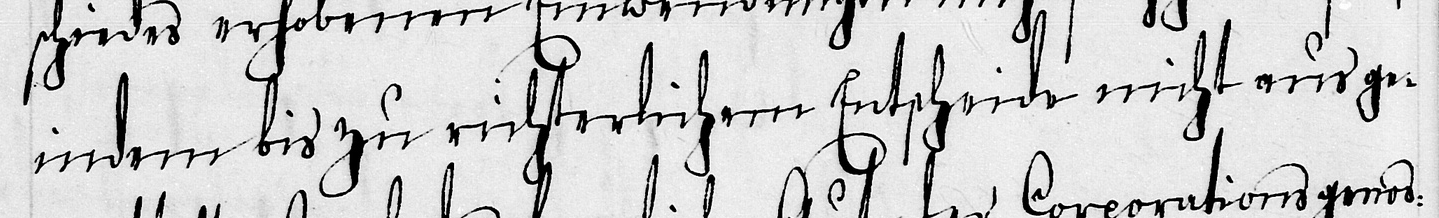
indem bis zu richterlichem Entscheide nicht ausge¬
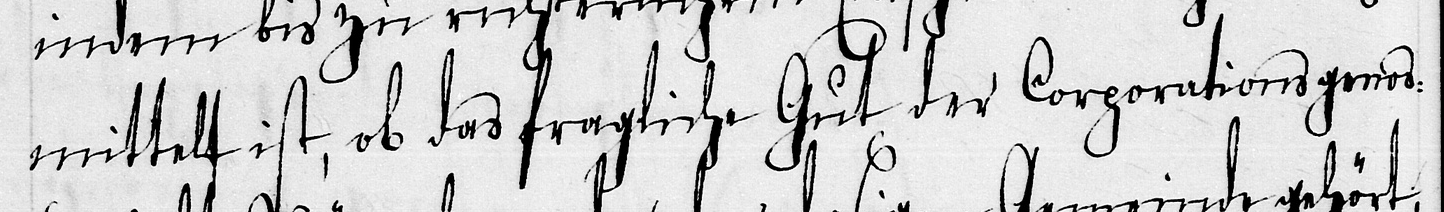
mittelt ist, ob das fragliche Gut der Corporationsgenoß¬
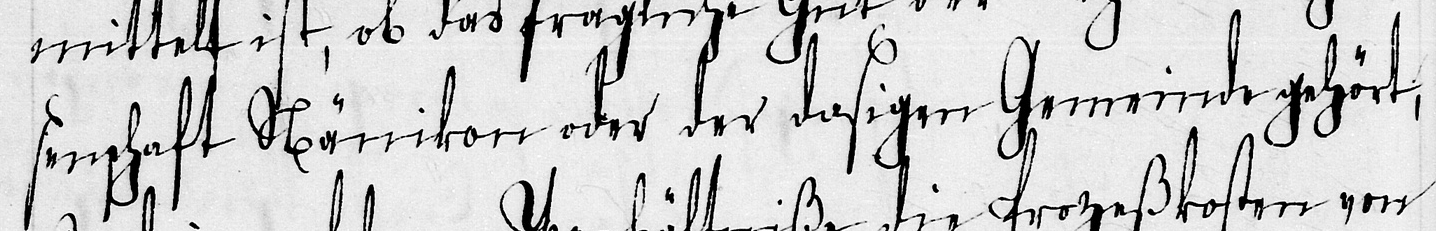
enschaft Nänikon oder der dasigen Gemeinde gehört,
